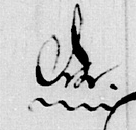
A.
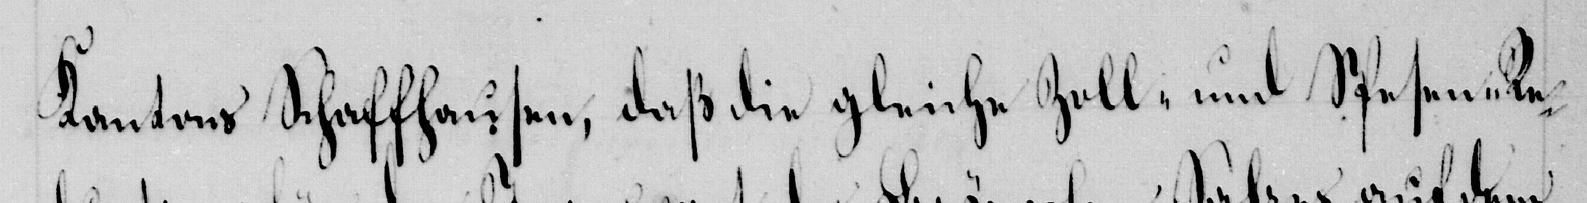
Kantons Schaffhausen, daß die gleiche Zoll- und Spesen-Re¬
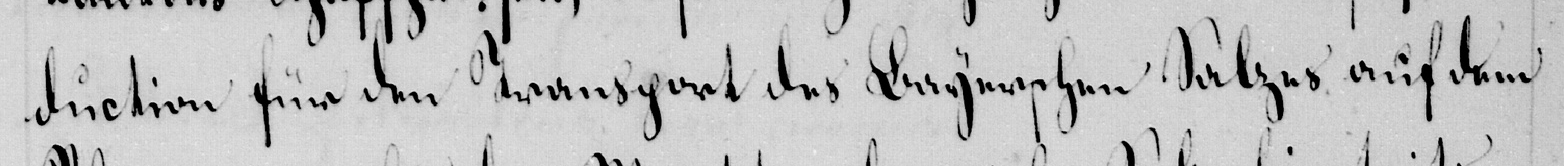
duction für den Transport des Bayerschen Salzes auf dem
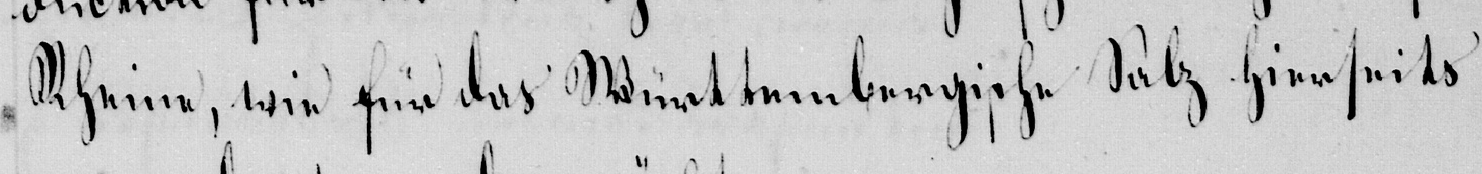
Rheine, wie für das Württembergische Salz hierseits
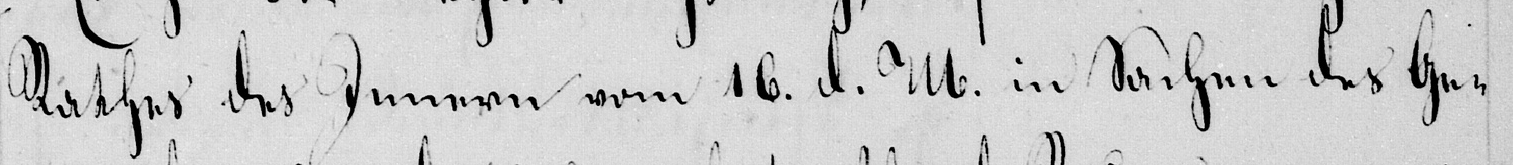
Rathes des Innern vom 16. d. M. in Sachen des Ge¬
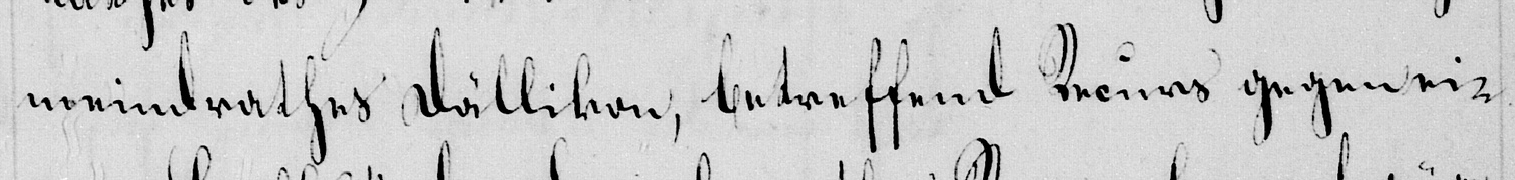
meindrathes Dällikon, betreffend Recurs gegen ei¬
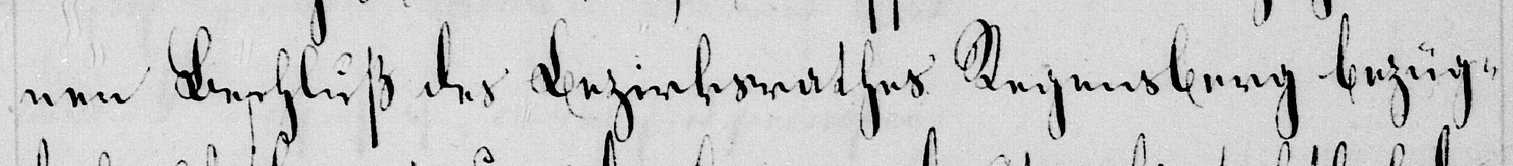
nen Beschluß des Bezirksrathes Regensberg bezüg¬
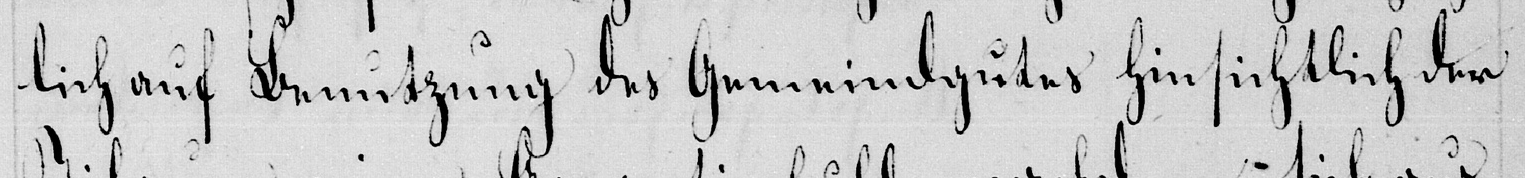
lich auf Benutzung des Gemeindgutes hinsichtlich der
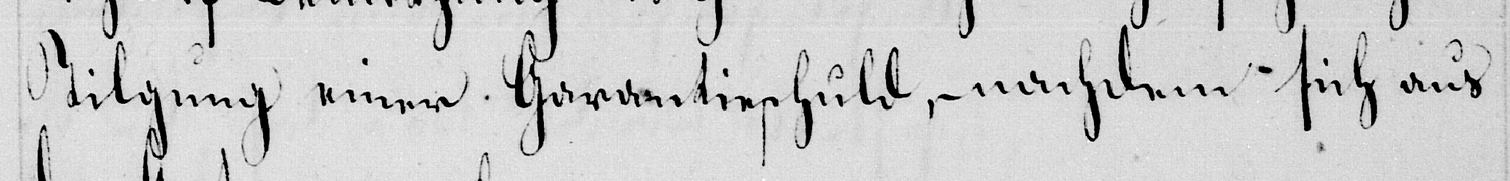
Tilgung einer Garantieschuld, – nachdem sich aus
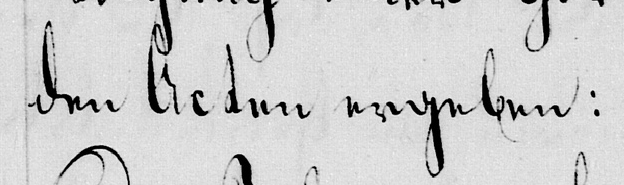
den Acten ergeben:
